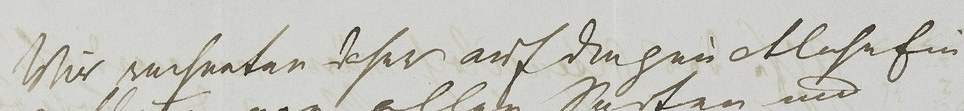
Wir rechneten daher auf die pünctliche Ein
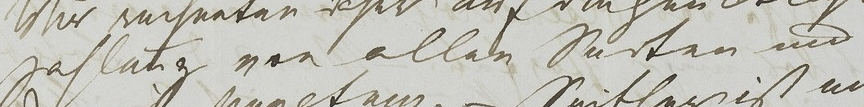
zahlung von allen Seiten und
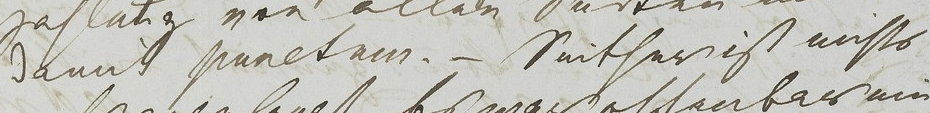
damit punctum. – Seither ist nichts
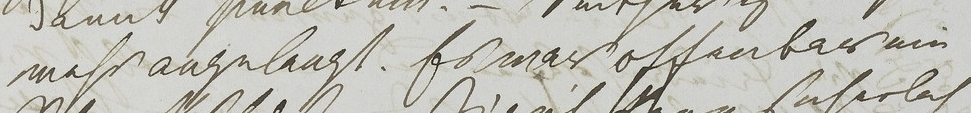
mehr angelangt. Es war offenbar ein
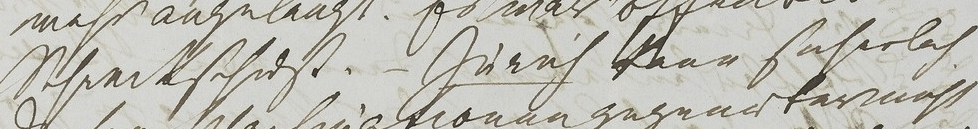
Schreckschuß. – Zürich kann sicherlich
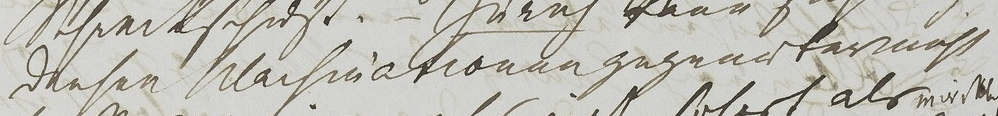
diesen Machinationen gegenüber nicht
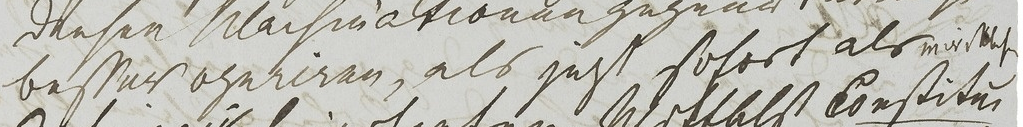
besser operiren, als jezt sofort als wircklicher
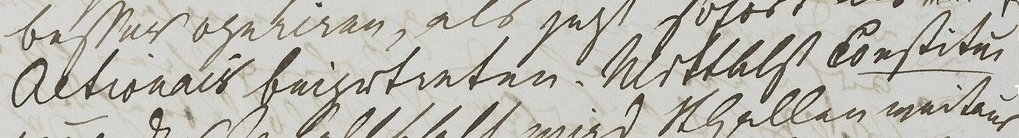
Actionair beizutreten. Mittlelst Constitui
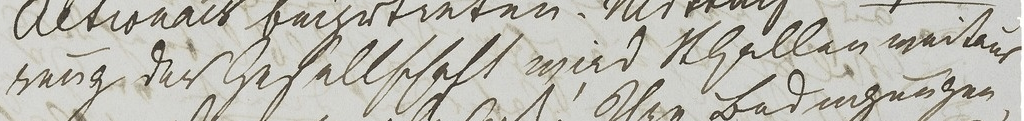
rung der Gesellschaft wird St. Gallen weitaus
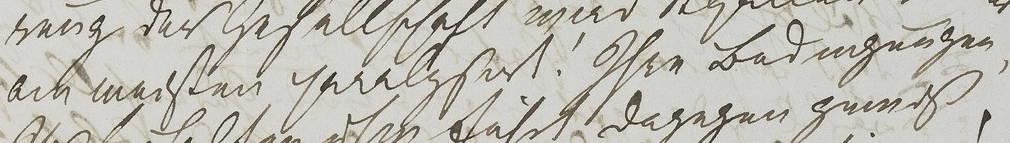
am meisten paralysirt! Ihre Bedingungen,
